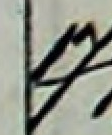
17
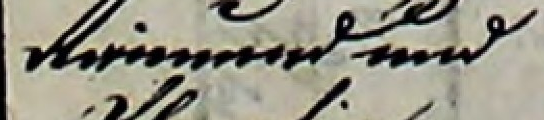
drimund und
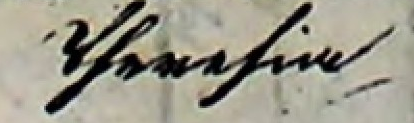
theresie
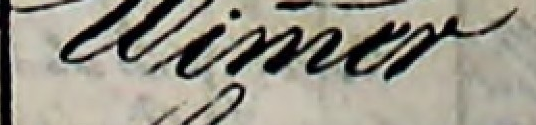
Wimmer
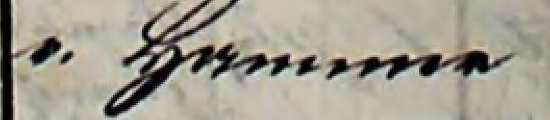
v. Hammer
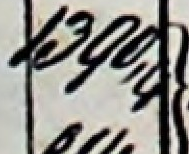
1390,4
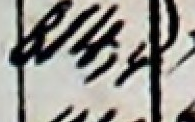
814,4
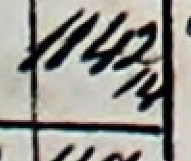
1142,4
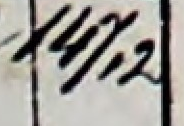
147,2
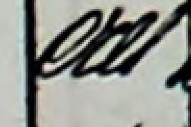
Alt
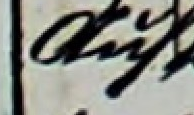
Aus
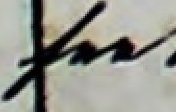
see
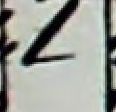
I
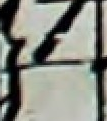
I
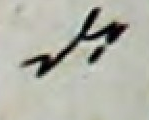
Do
